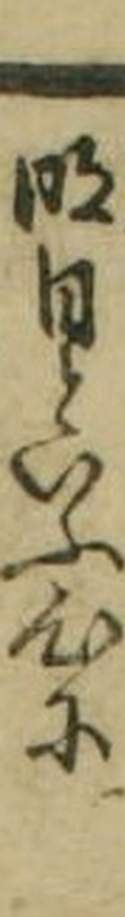明日といふ心に
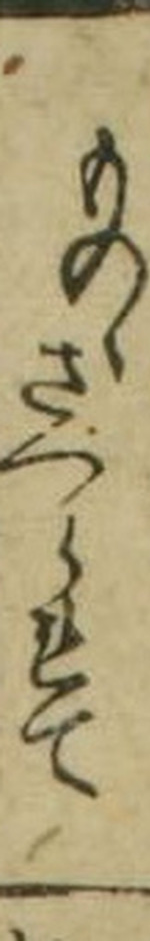ものゝさへられて
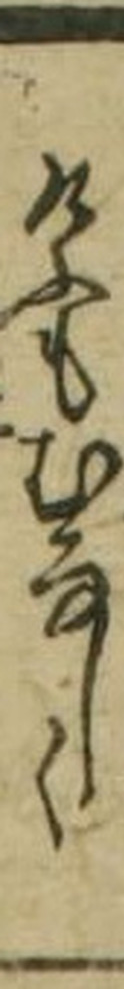けふもむなしく
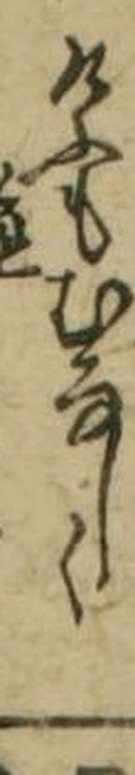けふもむなしく
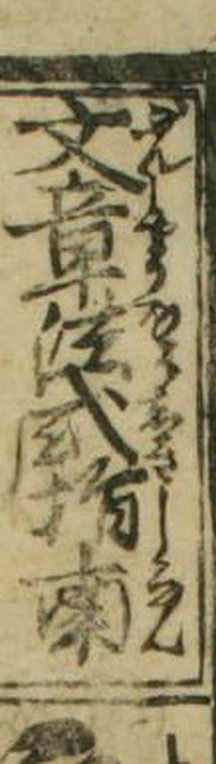文章法式指南
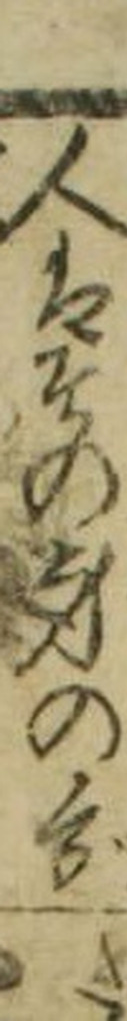人はその身の分
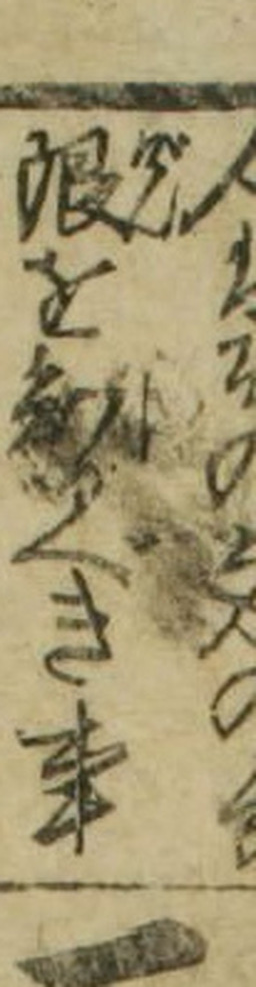限を知るべき事
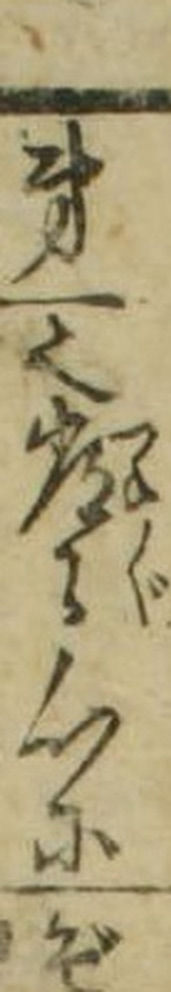第一也常々心に
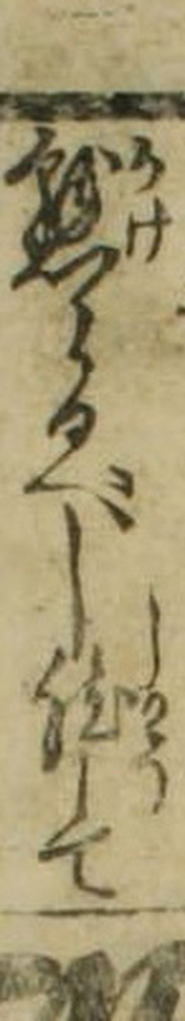懸らるべし然して
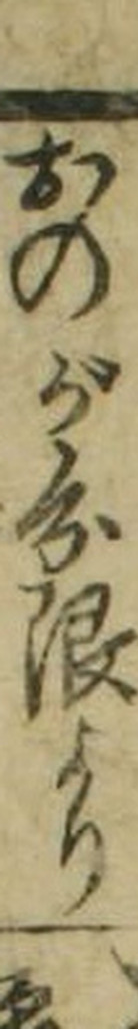おのが分限より
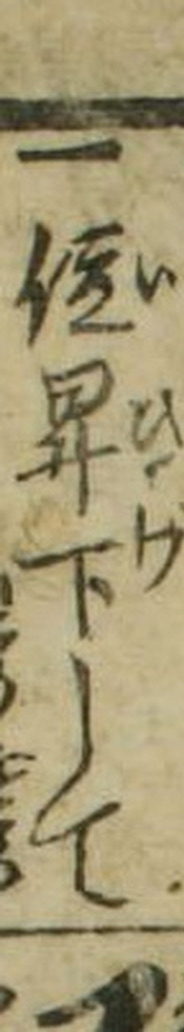一位卑下して
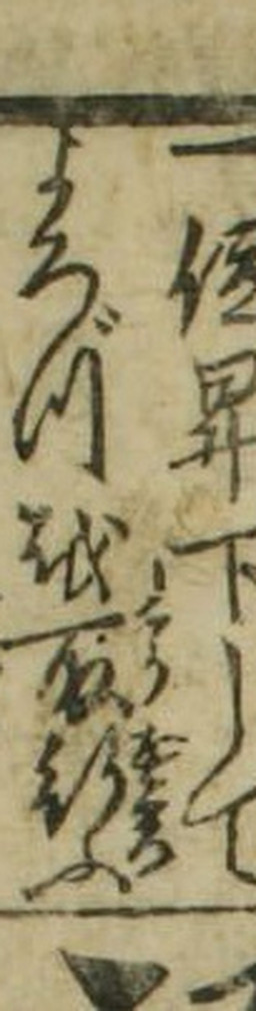よろづを取行ふ
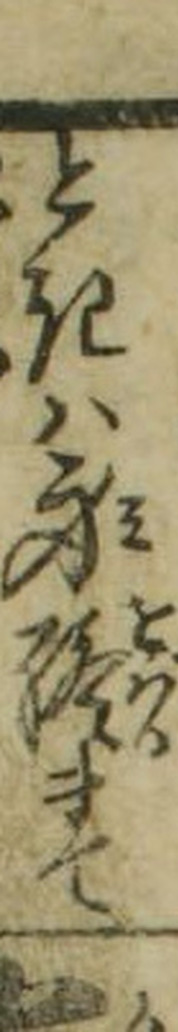ときは身終まて
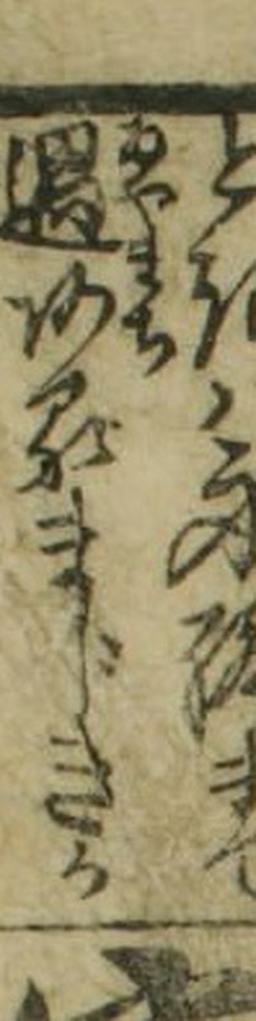過あるまじきか
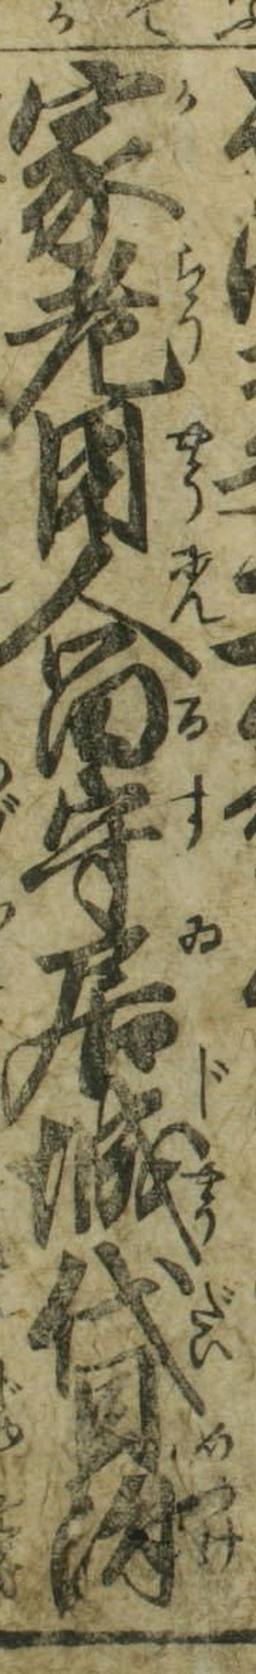家老用人留守居城代目附
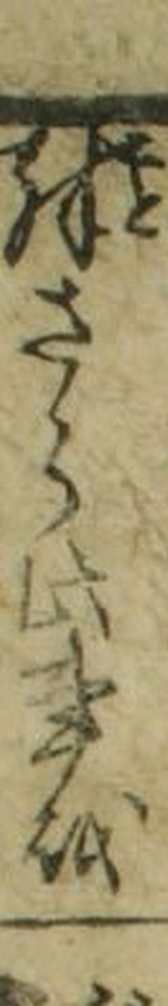殊さら此事を
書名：増補職人往来
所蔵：東京学芸大学教育コンテンツアーカイブ
